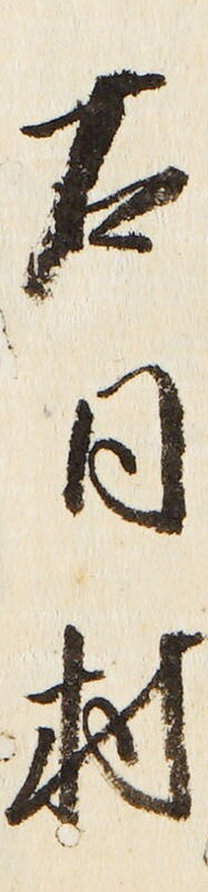右同村
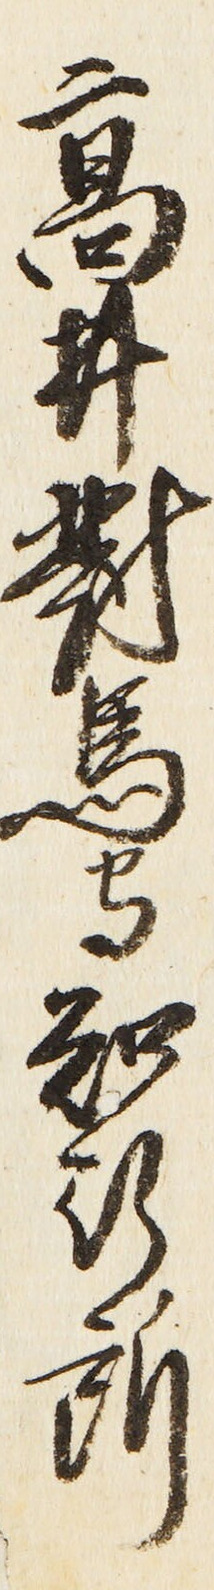高井対馬守知行所
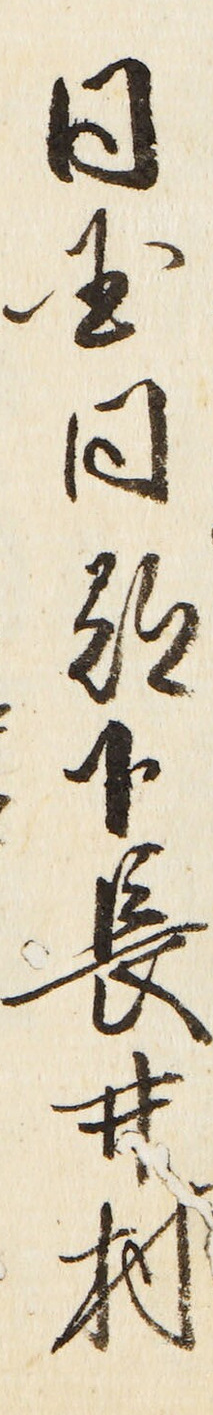同国同郡下長井村

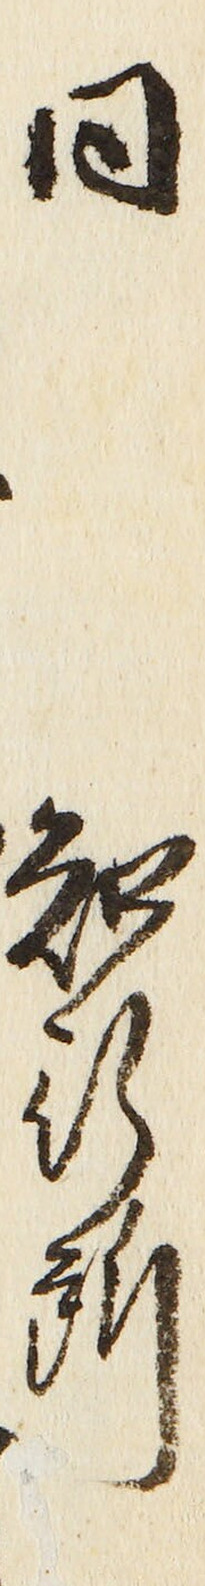同知行所
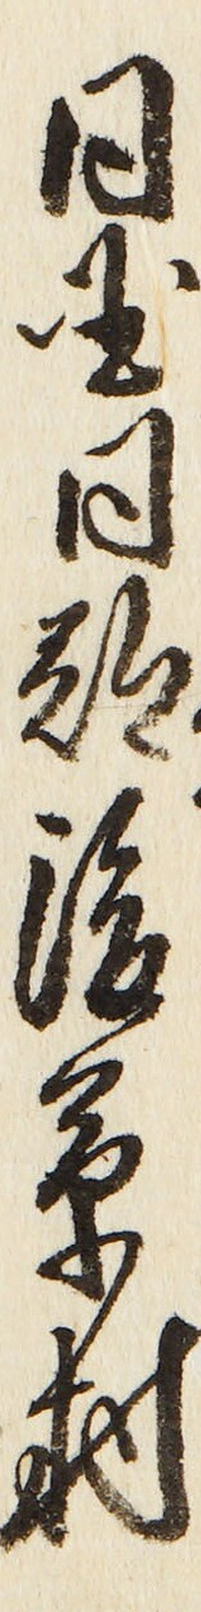同国同郡後草村
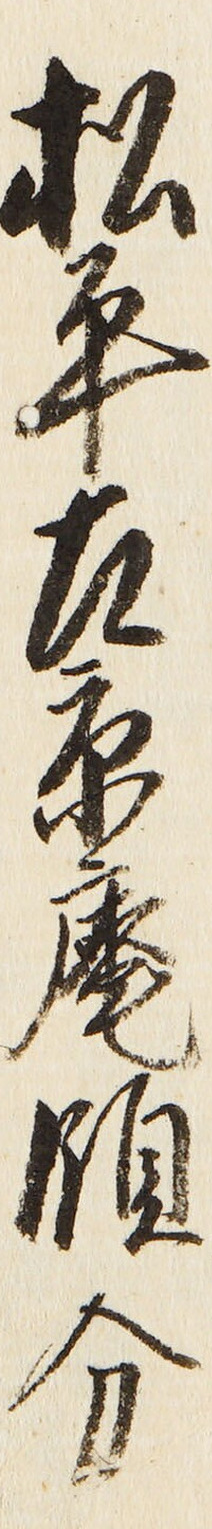松平左京庵領分
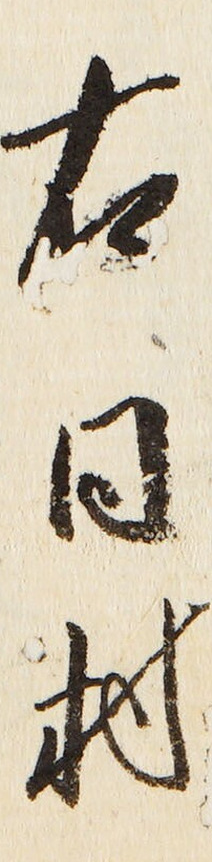右同村
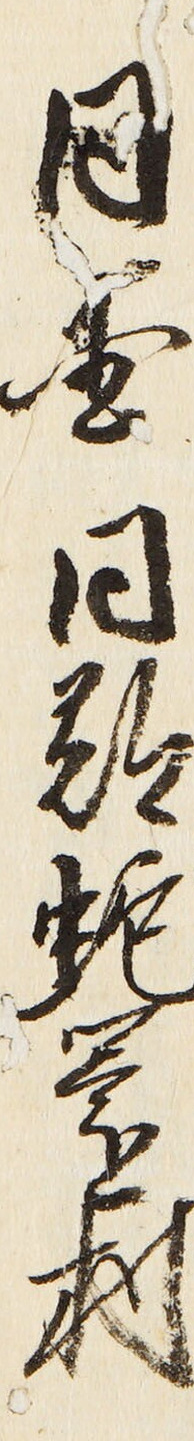同国同郡蛇園村
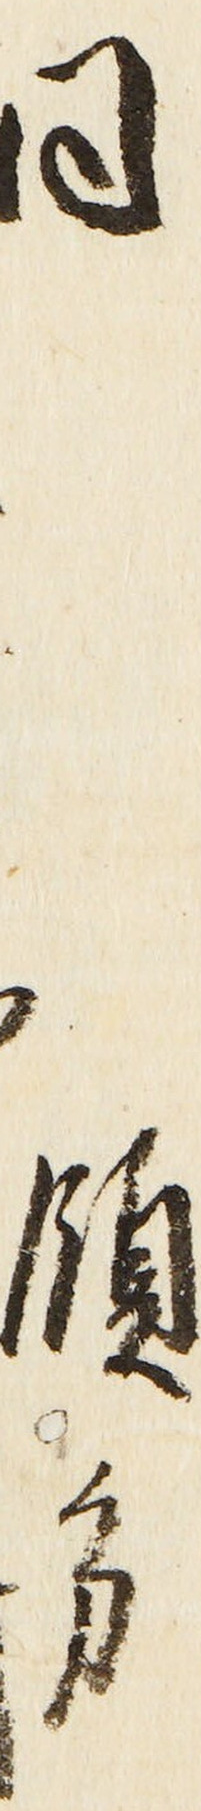同領分
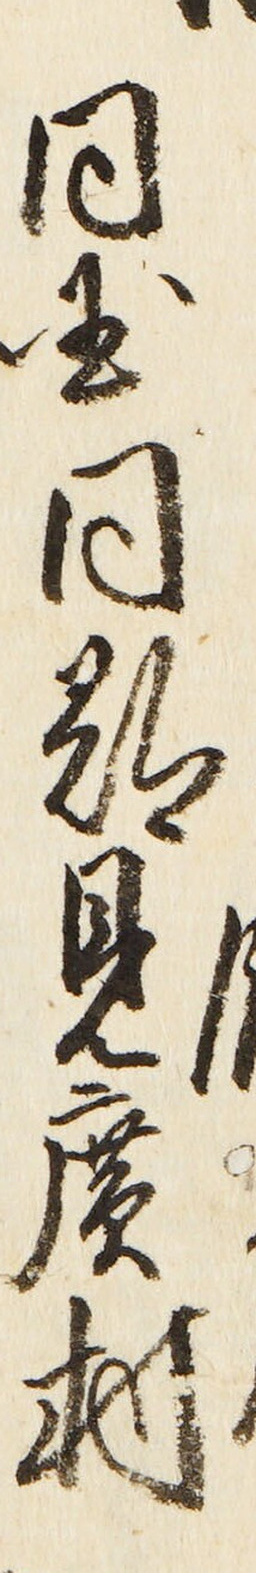同国同郡見広村

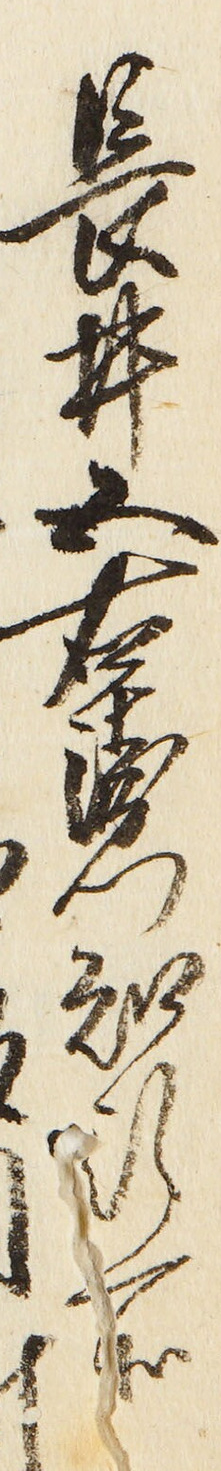長井五右衛門知行所
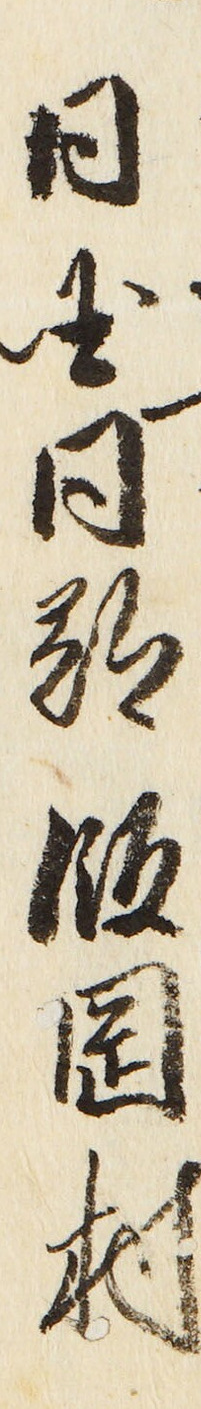同国同郡飯岡村
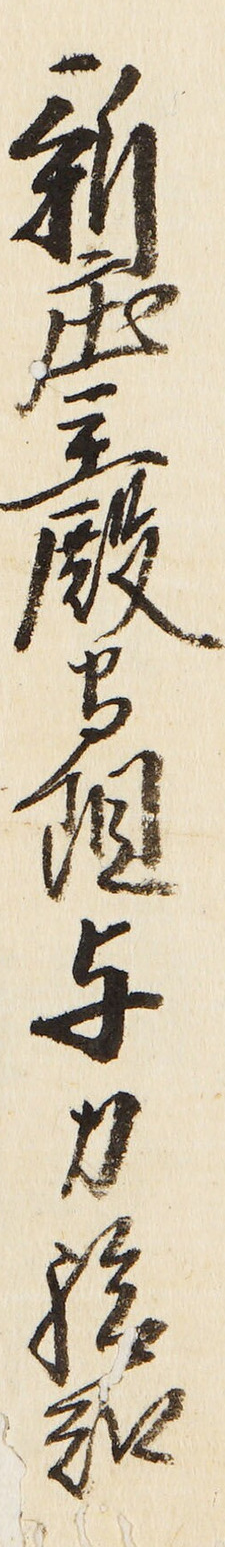新庄主殿守組与力給知
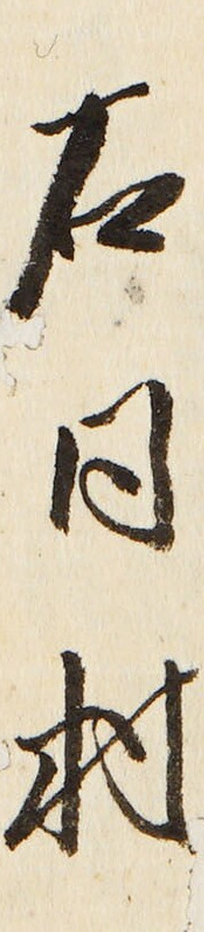右同村
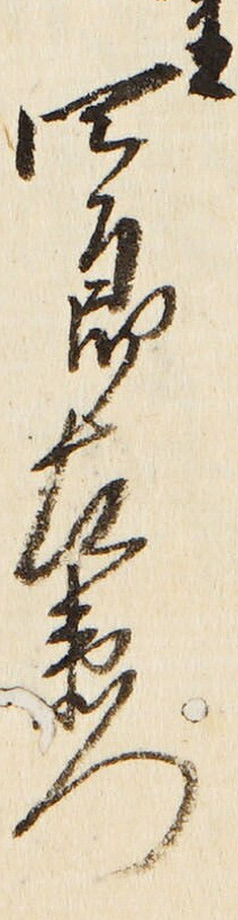名主四郎左衛門
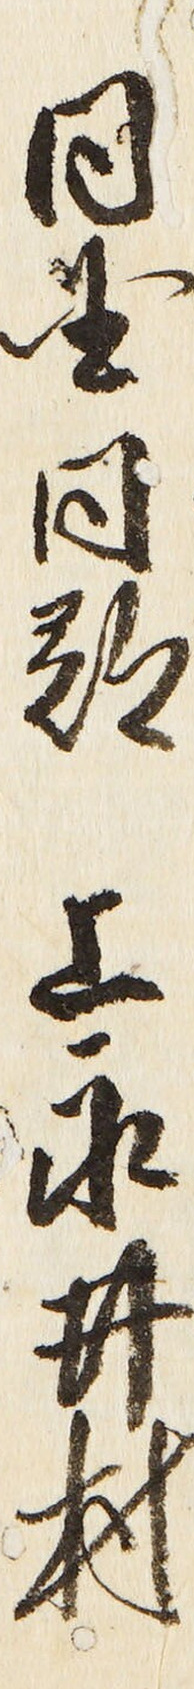同国同郡上永井村
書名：難船一件記録
